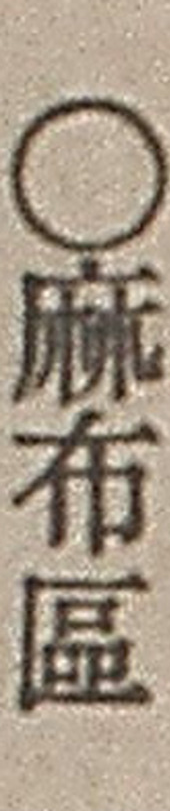〇麻布区
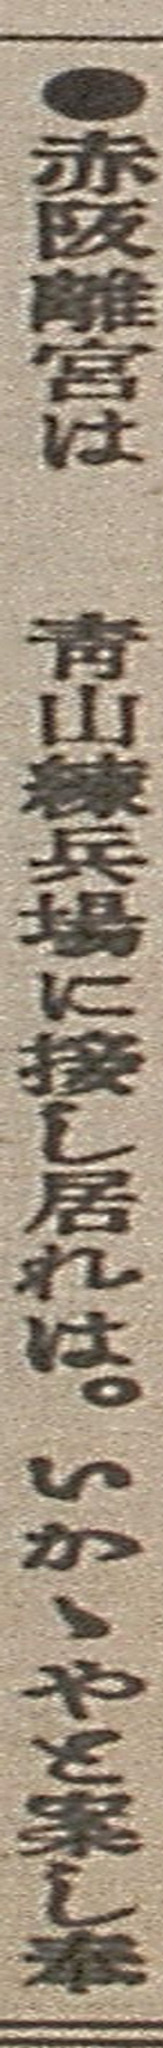●赤阪離宮は青山練兵場に接し居れは。いかゝやと案し奉
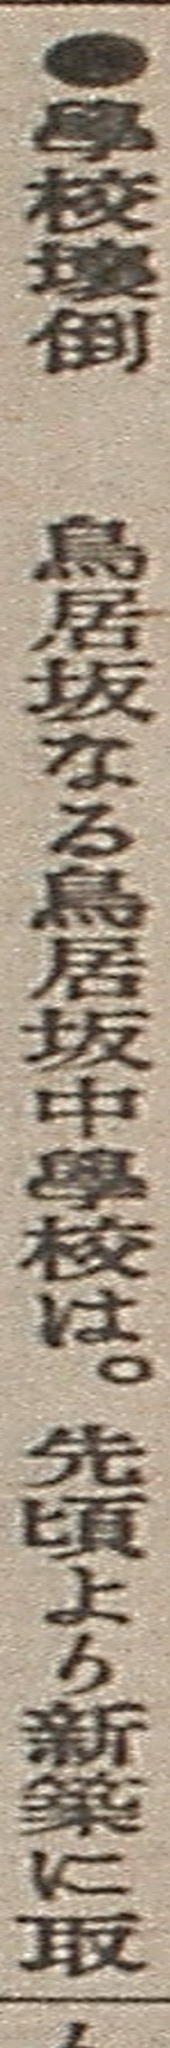●学校壊倒鳥居坂なる鳥居坂中学校は。先頃より新築に取
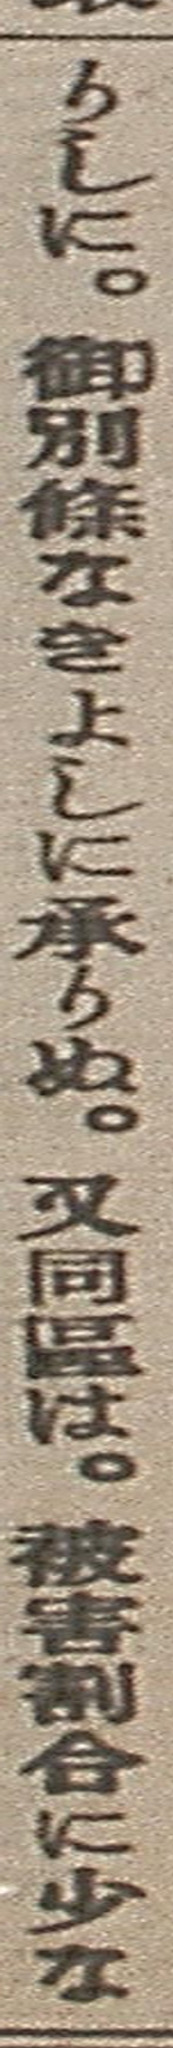りしに。御別条なきよしに承りぬ。又同区は。被害割合に少な
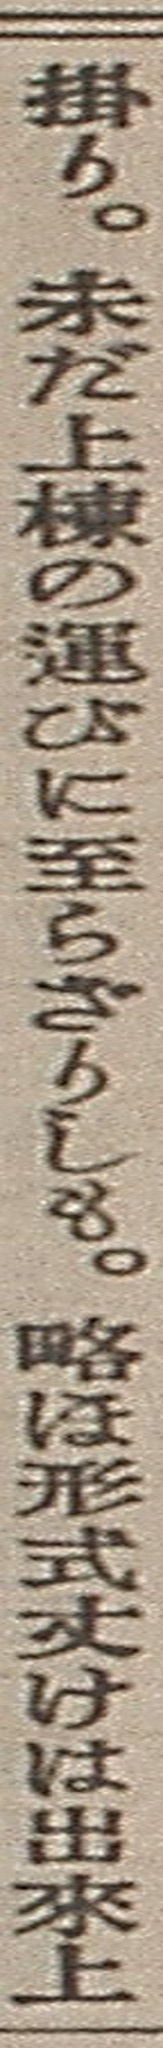掛り。未だ上棟の運びに至らざりしも。略ほ形式丈けは出来上
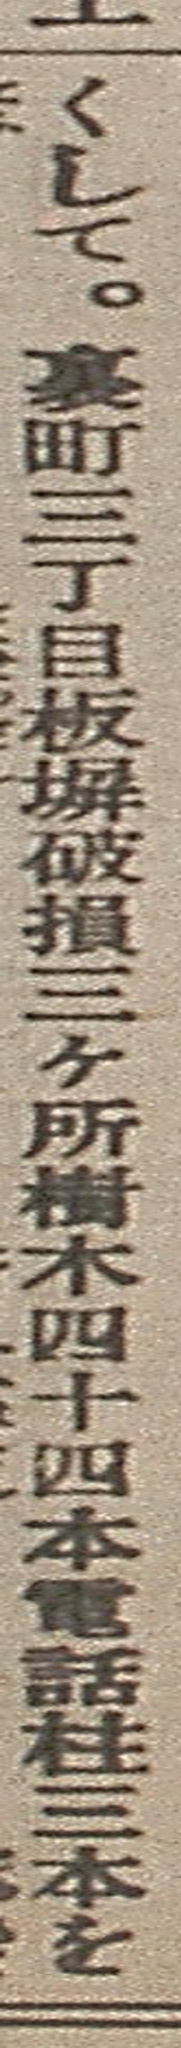くして。裏町三丁目板塀破損三ケ所樹木四十四本電話柱三本を
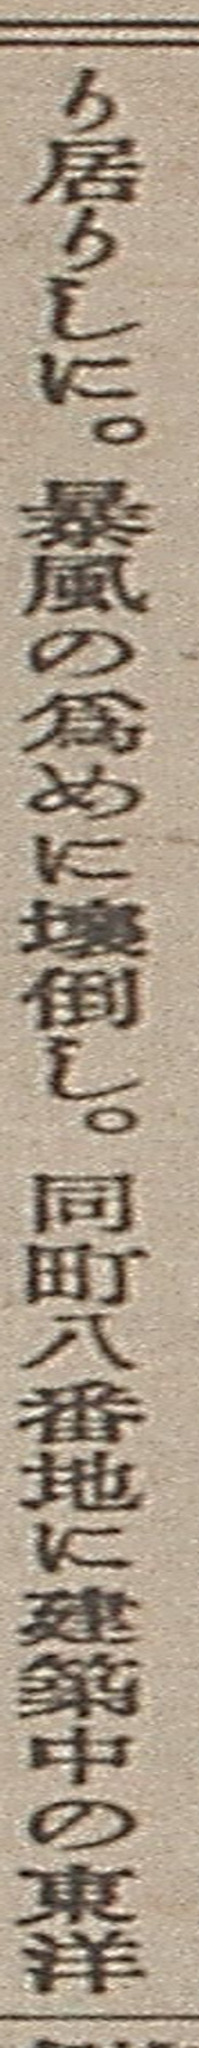り居りしに。暴風の為めに壊倒し。同町八番地に建築中の東洋
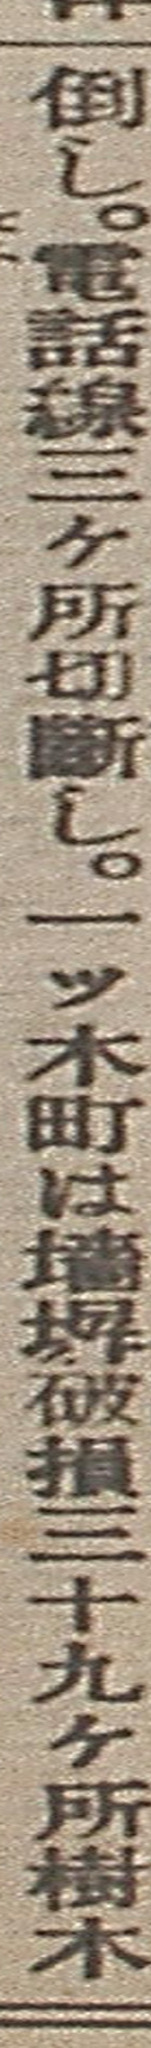倒し。電話線三ケ所切断し。一ツ木町は墻塀破損三十九ケ所樹木
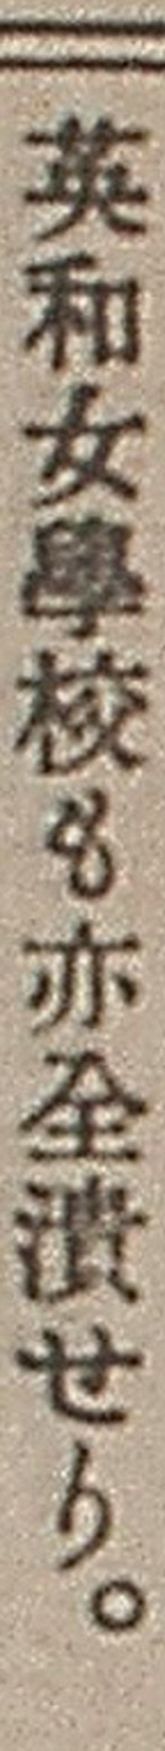英和女学校も亦全潰せり。
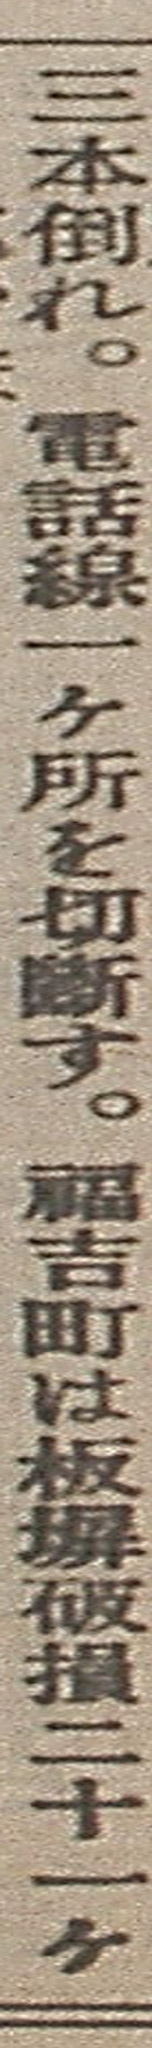三本倒れ。電話線一ケ所を切断す。福吉町は板塀破損二十一ケ
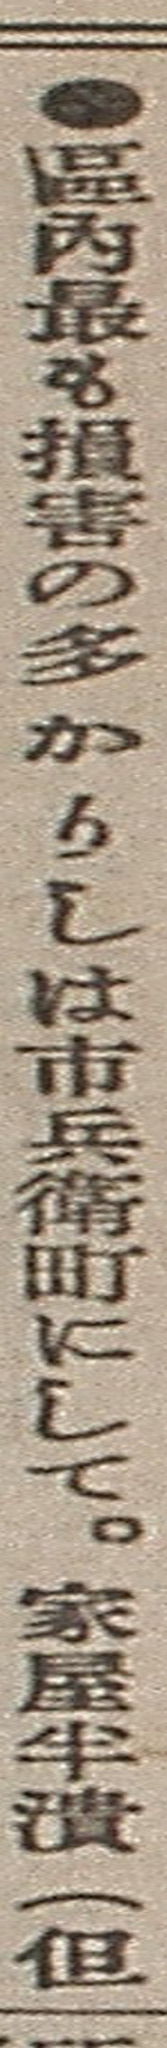●区内最も損害の多かりしは市兵衛町にして。家屋半潰（但
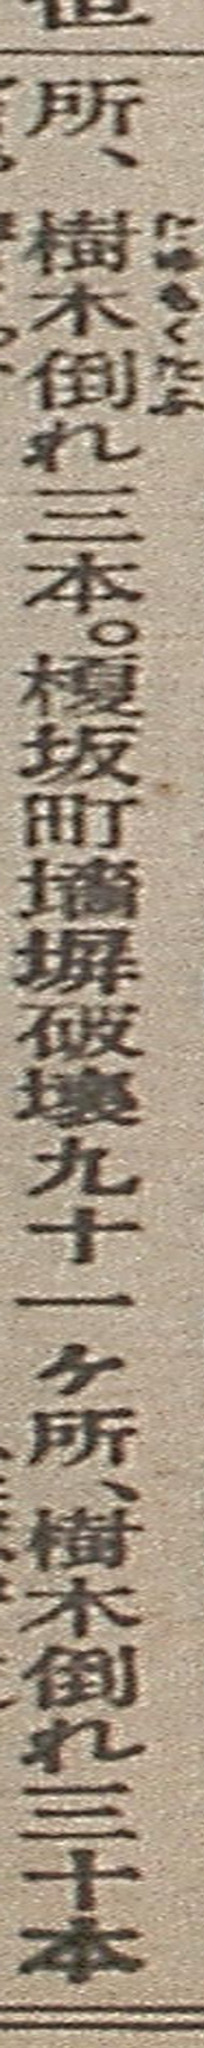所、樹木倒れ三本。榎坂町墻塀破壊九十一ケ所、樹木倒れ三十本
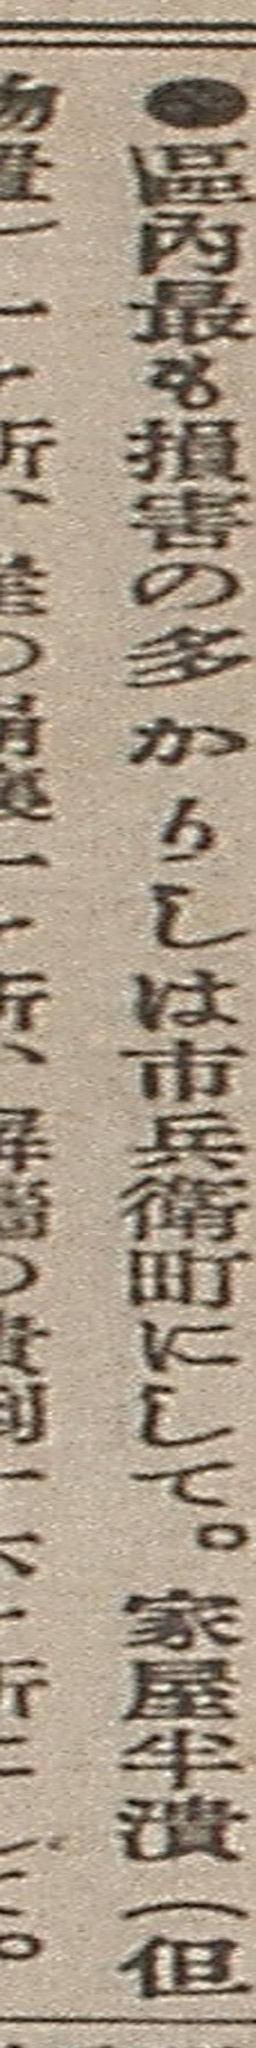物置）一ケ所、崖の崩壊一ケ所、塀墻の壊倒十六ケ所にして。
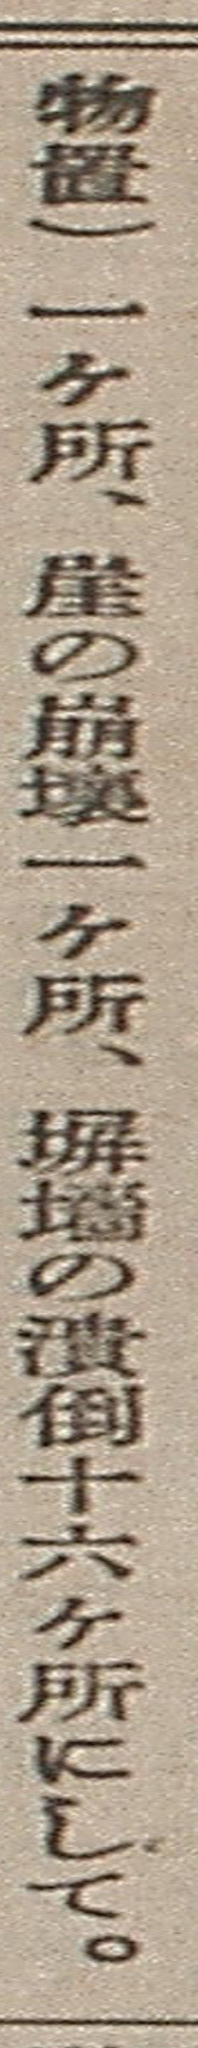物置）一ケ所、崖の崩壊一ケ所、塀墻の壊倒十六ケ所にして。
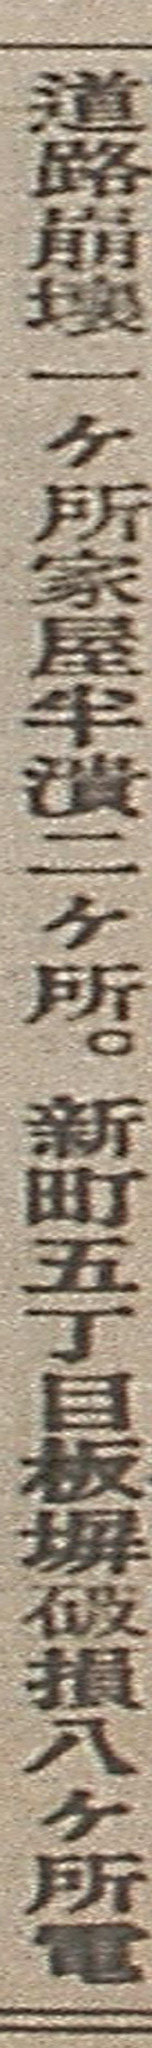道路崩壊一ケ所家屋半潰二ケ所。新町五丁目板塀破損八ケ所電
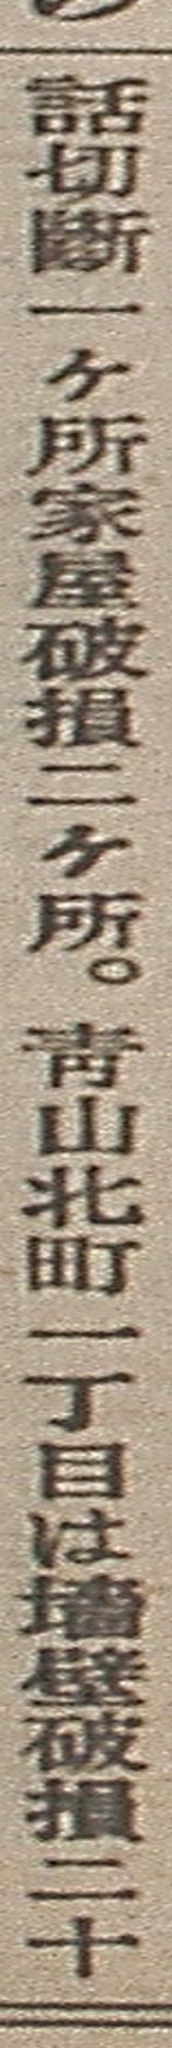話切断一ケ所家屋破損二ケ所。青山北町一丁目は墻壁破損二十
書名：風俗畫報臨時増刊第百九十九號　明治三十二年十月各地災害圖會（前編之續）
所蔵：東京大学地震研究所図書室 Earthquake Research Institute Library, The University of Tokyo, JAPAN
